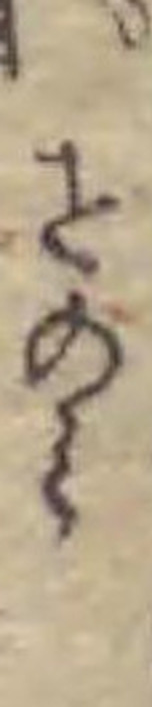をのみ
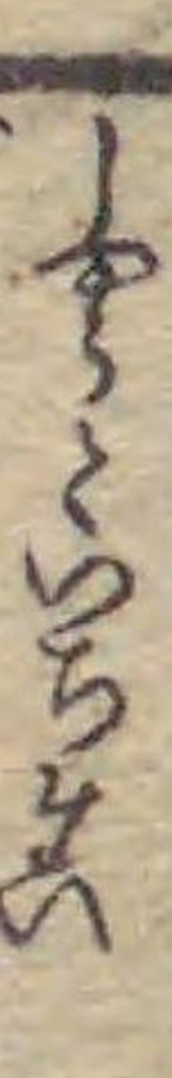しやうといちまい
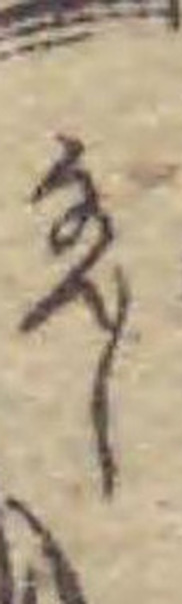なんし
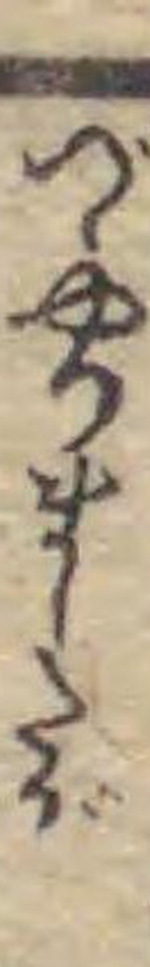づゝやりましたが
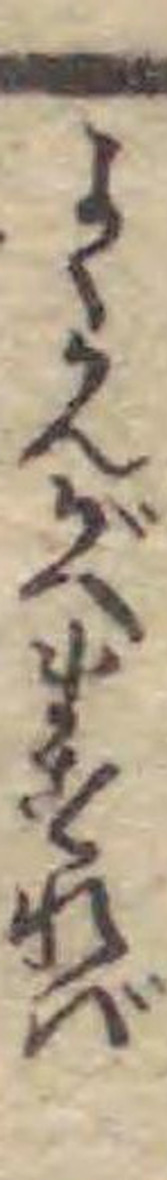よくかんがへますれば
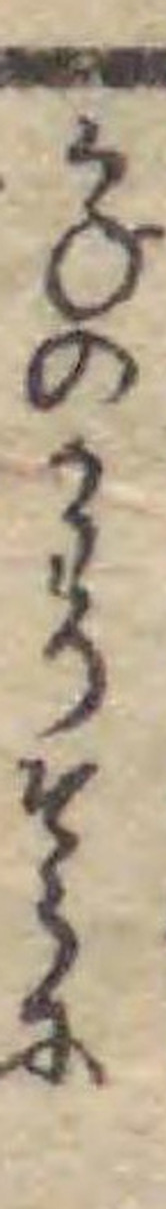かねのかわりそうに
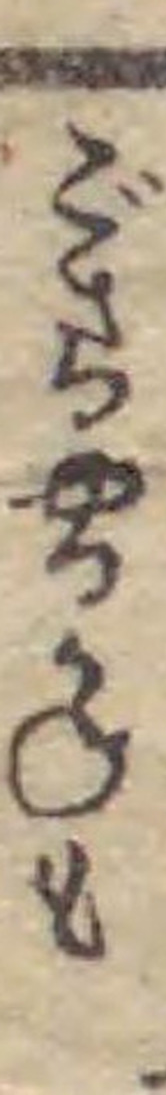ごさるやるかねも
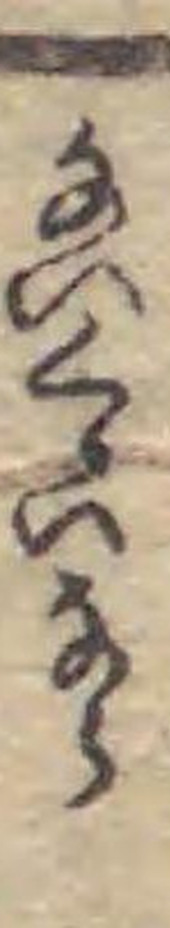ないくらいなら
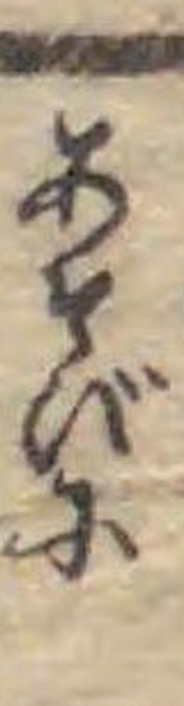あそびに
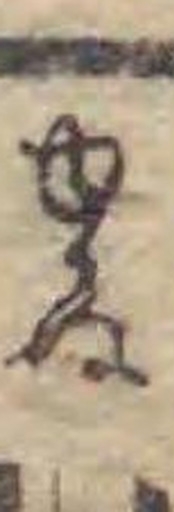ゆかぬ
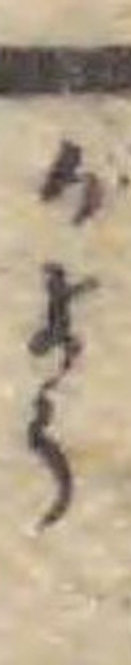がよう
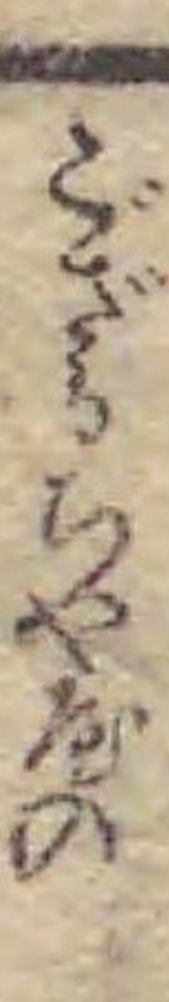ござるちや屋の
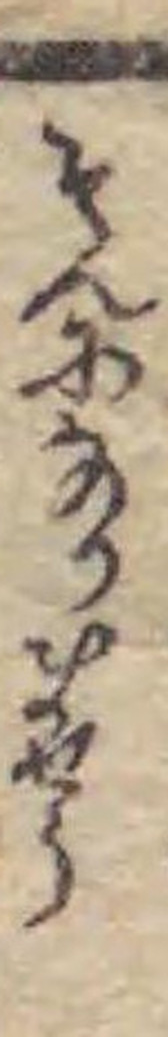そんになりませう
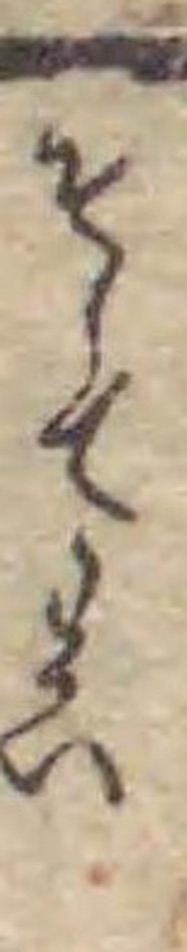そしてわかい
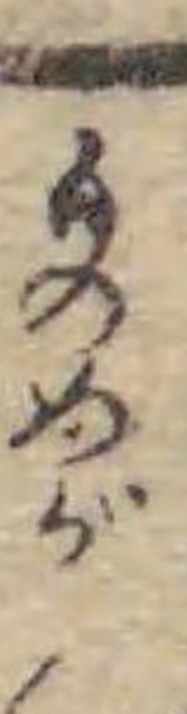ものめが
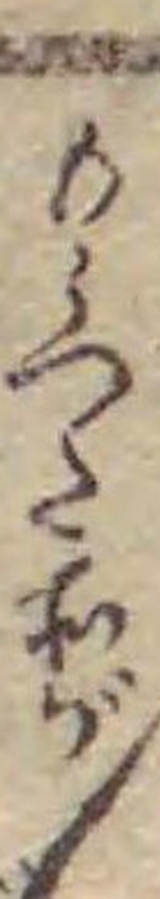もらつた所が
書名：紙屑身上噺 : 3巻
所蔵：国立国会図書館 National Diet Library, JAPAN
